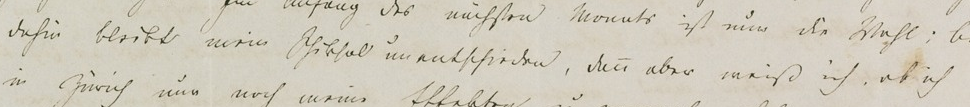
dahin bleibt mein Schiksal unentschieden, dann aber weiß ich, ob ich
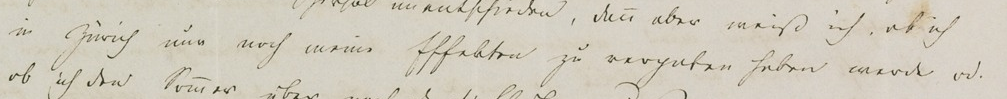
in Zürich nur noch meine Effekten zu vergaben haben werde od.
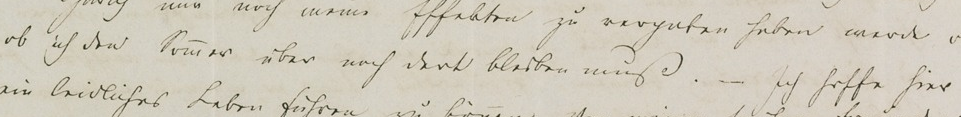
ob ich den Sommer über noch dort bleiben muß. – Ich hoffe hier
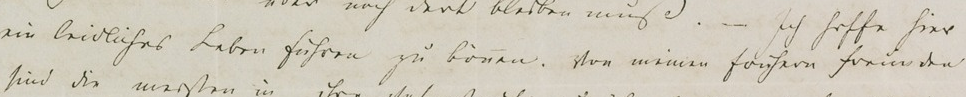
ein leidliches Leben führen zu können. Von meinen frühern Freunden
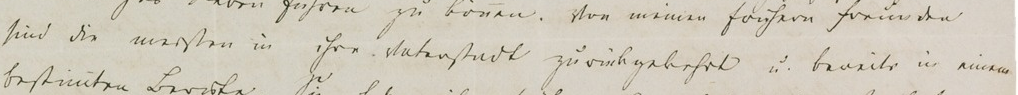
sind die meisten in ihre Vaterstadt zurückgekehrt u. bereits in einem
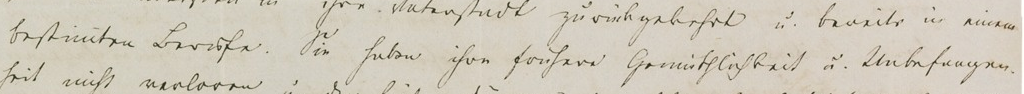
bestimmten Berufe. Sie haben ihre frühere Gemüthlichkeit u. Unbefangen-
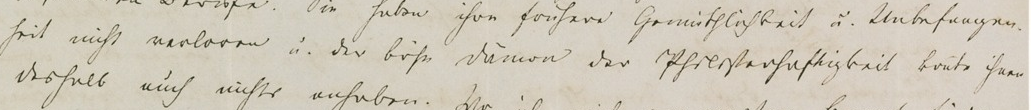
heit nicht verloren u. der böse Dämon der Philisterhaftigkeit konnte ihnen
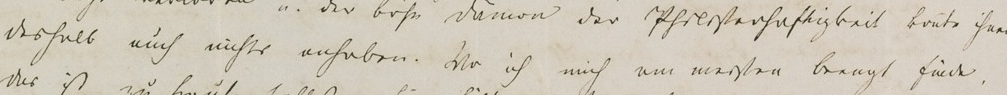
deshalb auch nichts anhaben. Wo ich mich am meisten beengt finde,
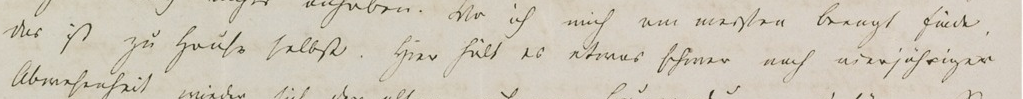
das ist zu Hause selbst. Hier hält es etwas schwer nach vierjähriger
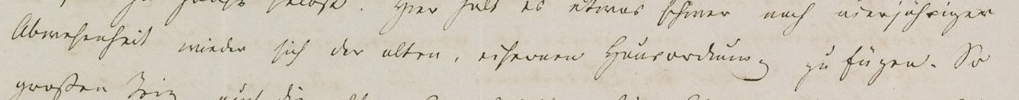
Abwesenheit wieder sich der alten, eisernen Hausordnung zu fügen. So
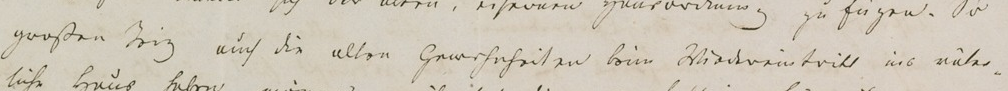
großen Reiz auch die alten Gewohnheiten beim Wiedereintritt ins väter-
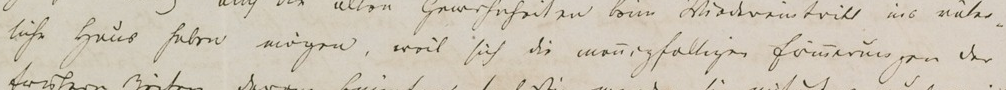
liche Haus haben mögen, weil sich die mannigfaltigen Erinnerungen der
